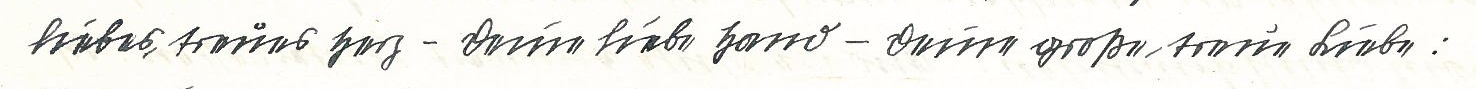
liebes, treues Herz – Deine liebe Hand – Deine große treue Liebe:
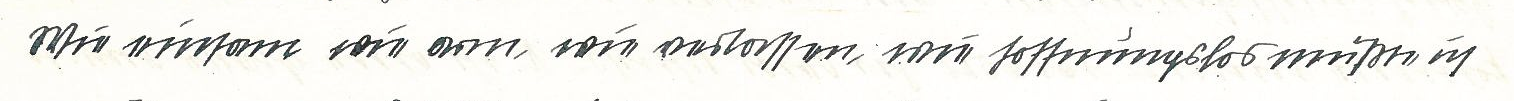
Wie einsam wie arm, wie verlassen, wie hoffnungslos müßte ich
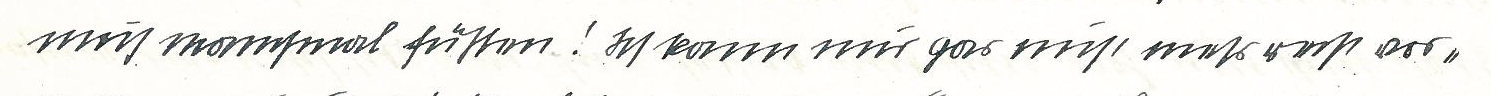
mich manchmal fühlen! Ich kann mir gar nicht mehr recht vor¬
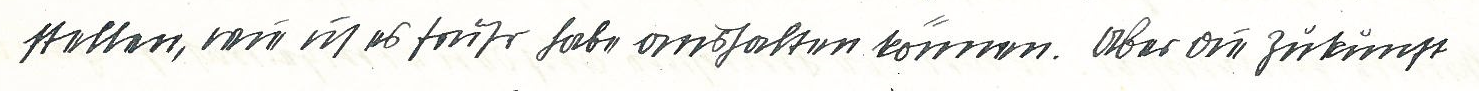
stellen, wie ich es früher habe aushalten können. Aber die Zukunft
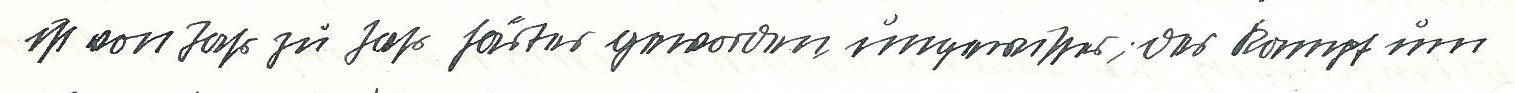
ist von Jahr zu Jahr härter geworden, ungewisser; der Kampf um
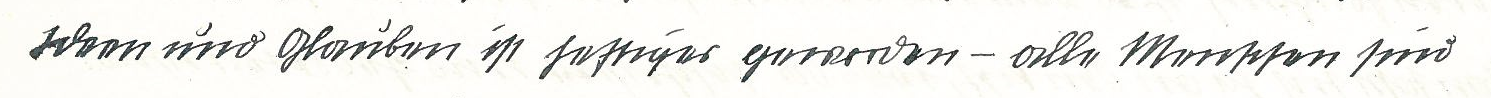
Ideen und Glauben ist heftiger geworden – alle Menschen sind
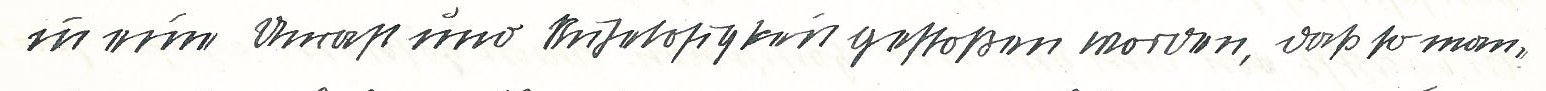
in eine Unrast und Ruhelosigkeit gestoßen worden, daß so man¬
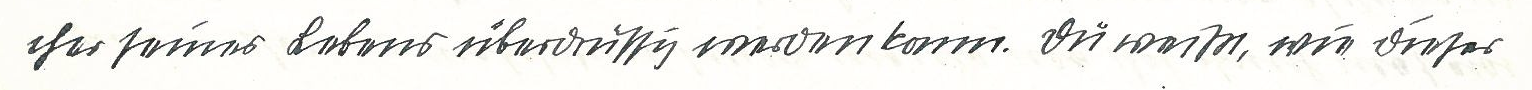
cher seines Lebens überdrüssig werden kann. Du weißt, wie dieser
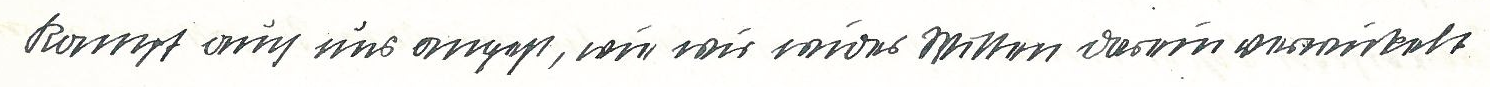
Kampf auch uns angeht, wie wir wider Willen darin verwickelt
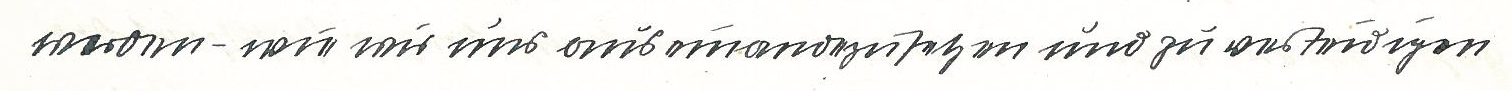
werden – wie wir uns auseinanderzusetzen und zu verteidigen
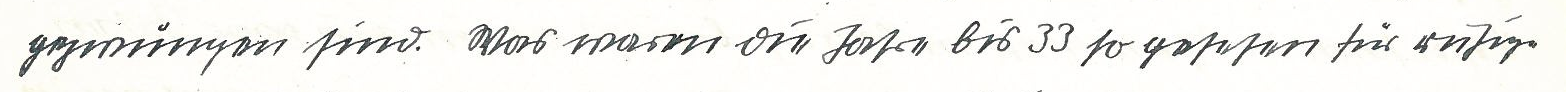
gezwungen sind. Was waren die Jahre bis 33 so gesehen für ruhige
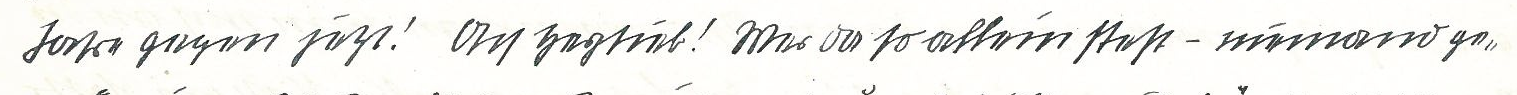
Jahre gegen jetzt! Ach Herzlieb! Wer da so allein steht – niemand ge¬
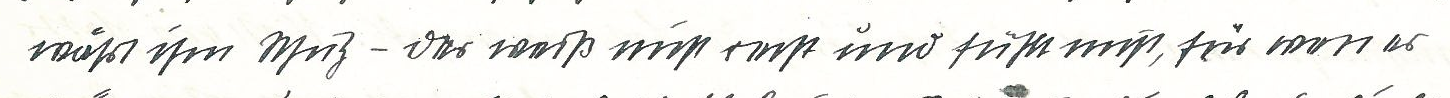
währt ihm Schutz – der weiß nicht recht und fühlt nicht, für was er
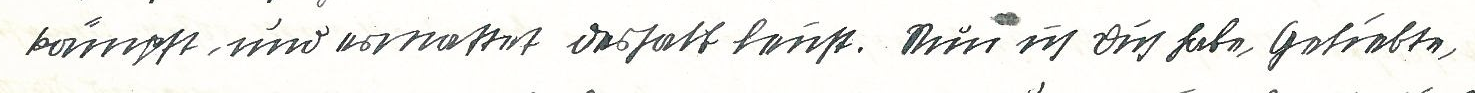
kämpft, und ermattet deshalb leicht. Nun ich Dich habe, Geliebte,
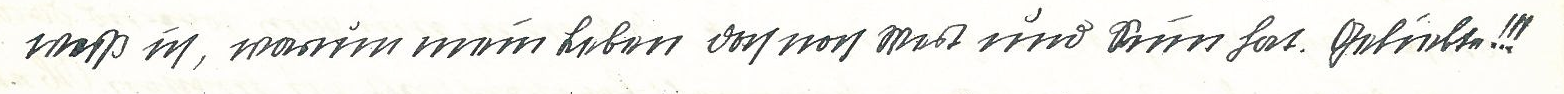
weiß ich, warum mein Leben doch noch Wert und Sinn hat. Geliebte!!!
